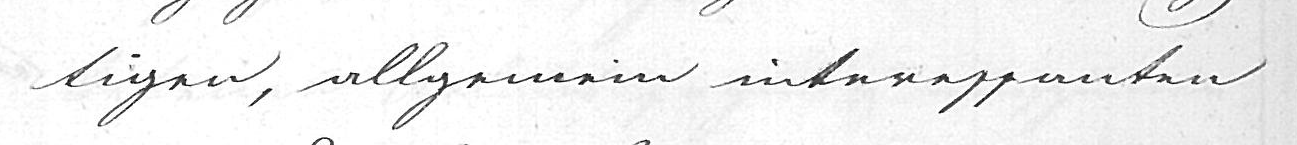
tigen, allgemein interessanten
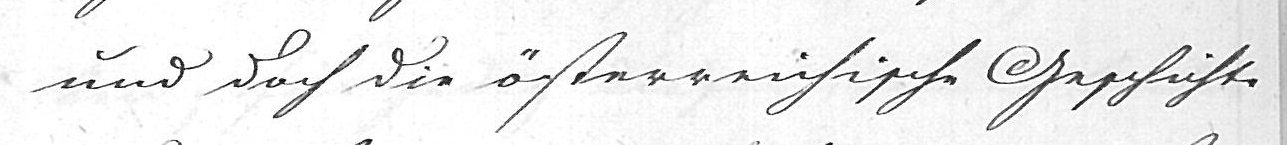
und doch die österreichische Geschichte
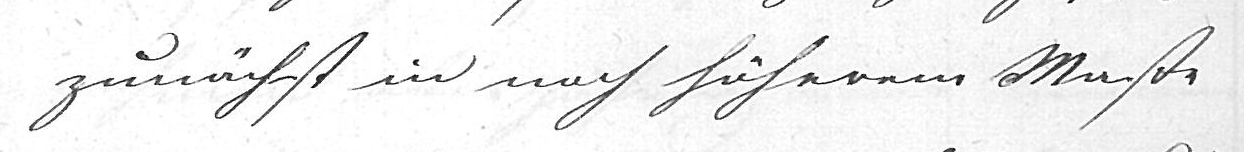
zunächst in noch höheren Maße
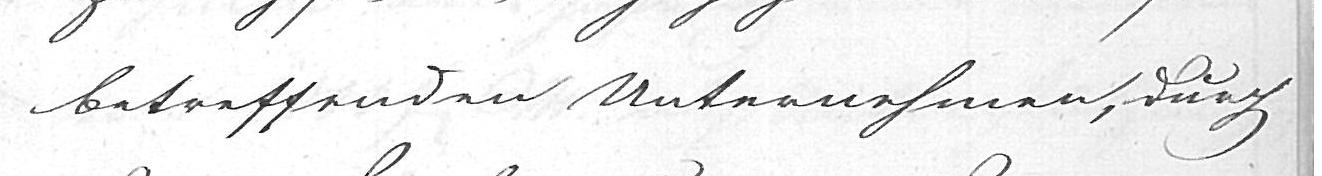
betreffenden Unternehmen, durch
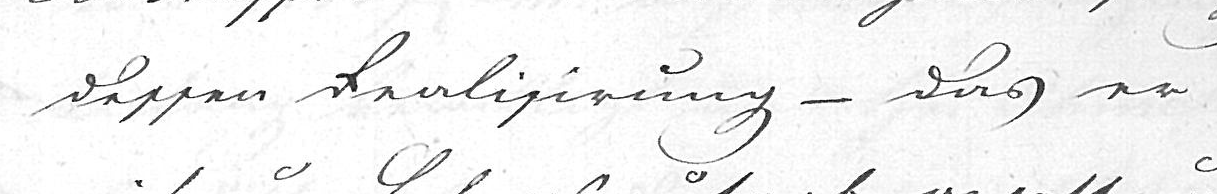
dessen Realisirung - das er
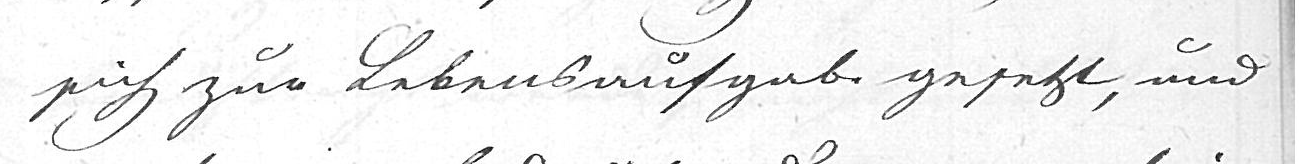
sich zur Lebensaufgabe gesetzt, und
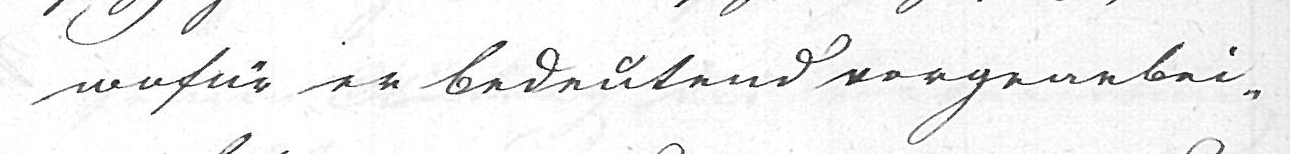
wofür er bedeutend vorgearbei-
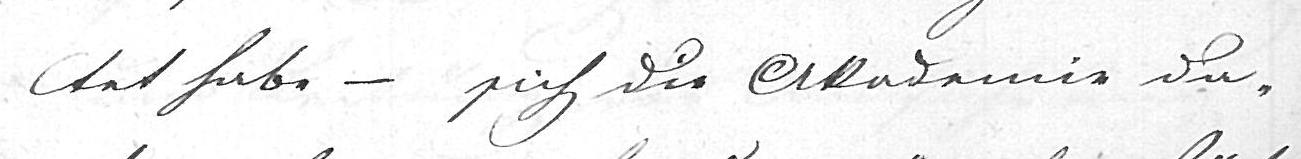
tet habe - sich die Akademie da-
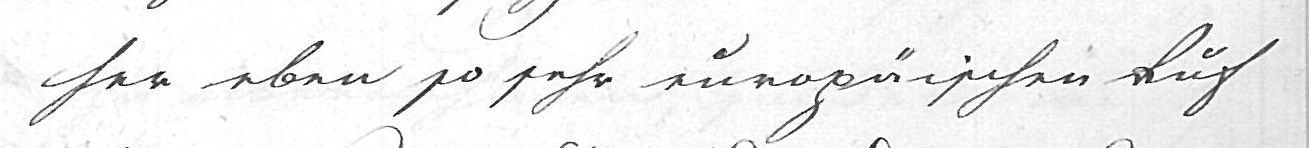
her eben so sehr europäischen Ruf
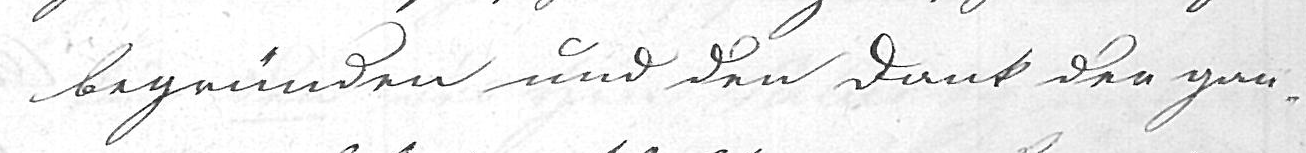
begründen und den Dank der gan-
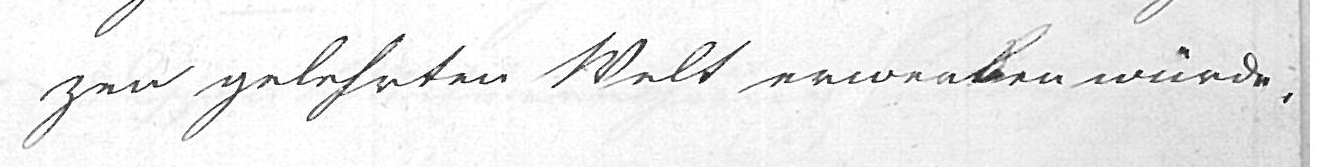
zen gelehrten Welt erwerben würde.
